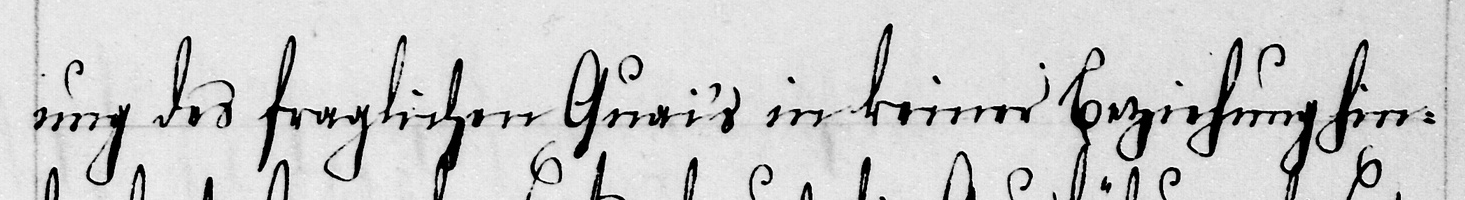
ung des fraglichen Quai’s in keiner Beziehung hin¬
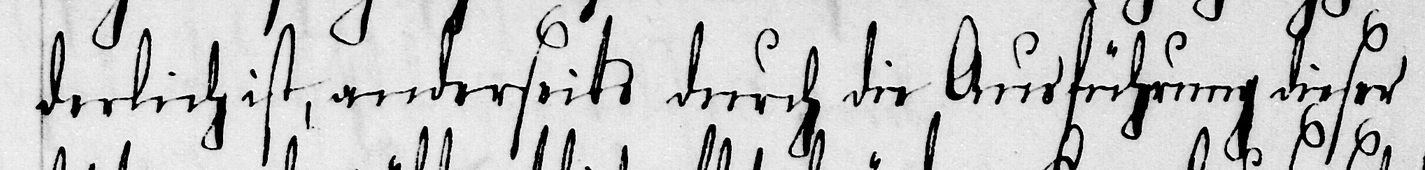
derlicht ist, anderseits durch die Ausführung dieser
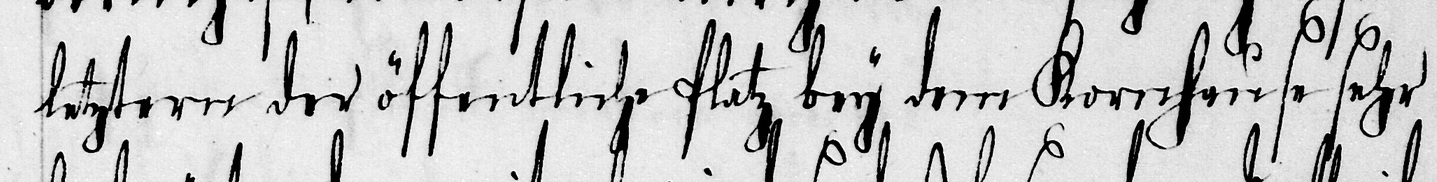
letztern der öffentliche Platz bey dem Kornhause sehr
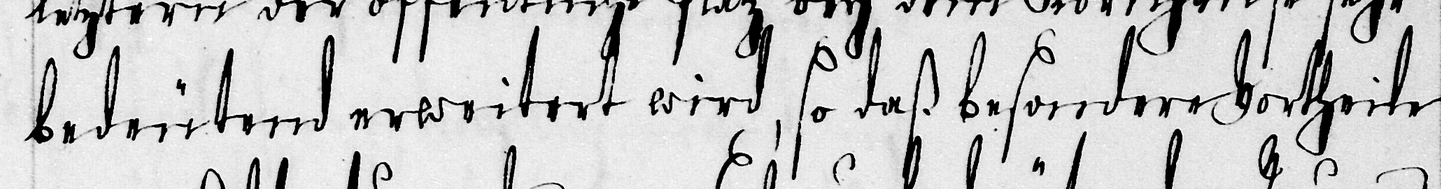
bedeutend erweitert wird, so daß besondere Vortheile
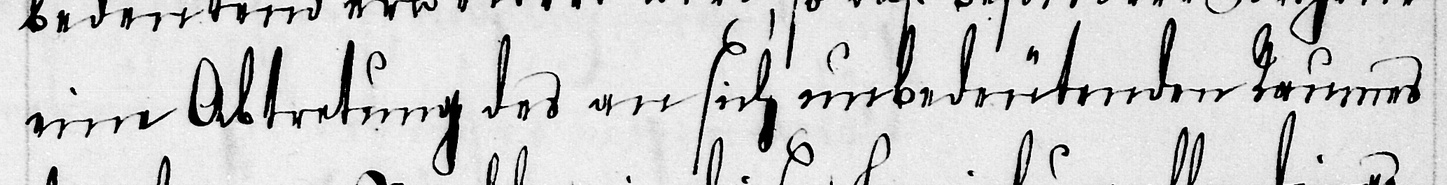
eine Abtretung des an sich unbedeutenden Raumes
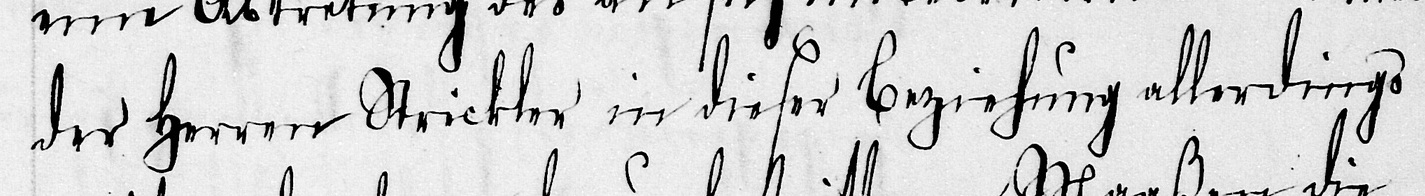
der Herren Strickler in dieser Beziehung allerdings
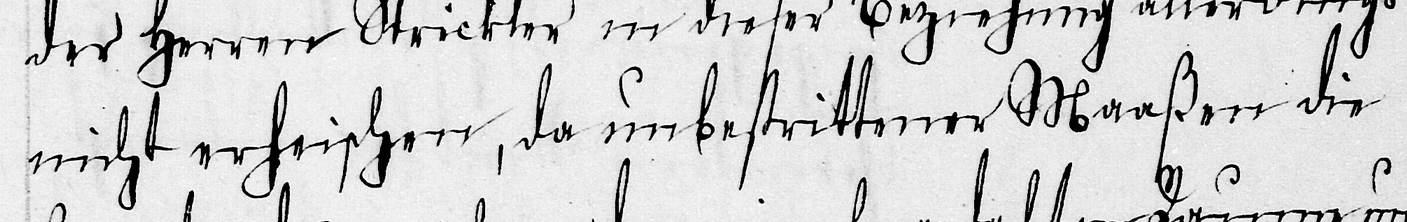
nicht erheischen, da unbestrittener Maaßen die
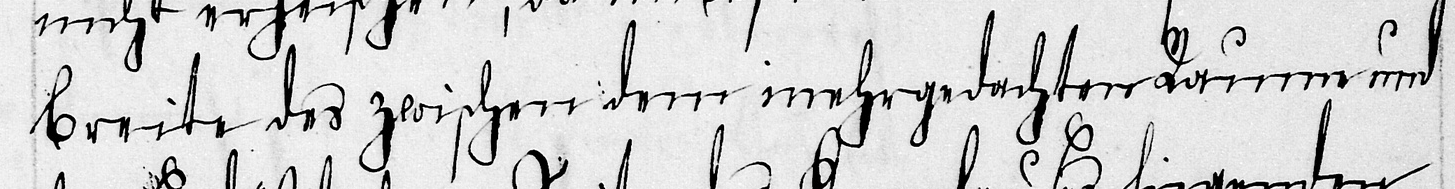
Breite des zwischen dem mehrgedachten Raume und
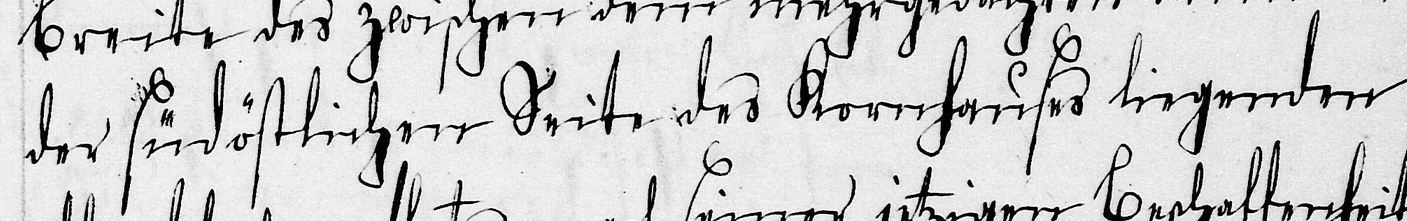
der südöstlichen Seite des Kornhauses liegenden
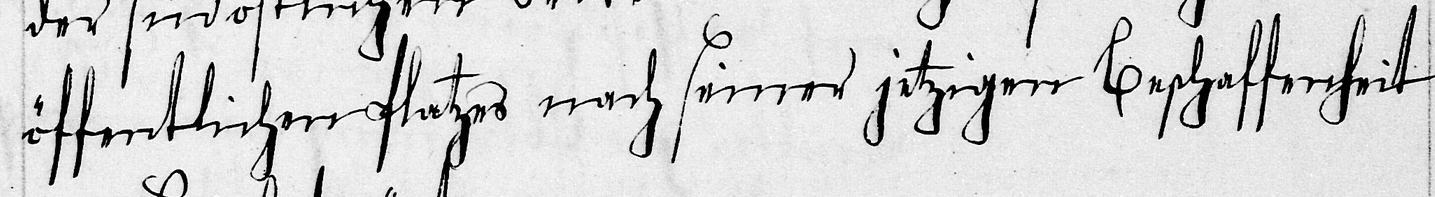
öffentlichen Platzes nach seiner jetzigen Beschaffenheit
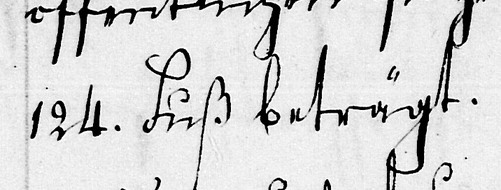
124. Fuß beträgt.
